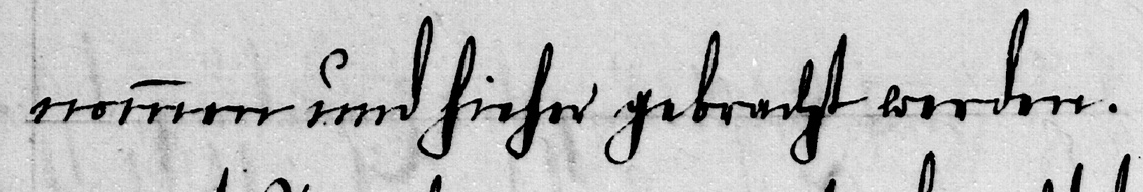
nommen und hieher gebracht werden.
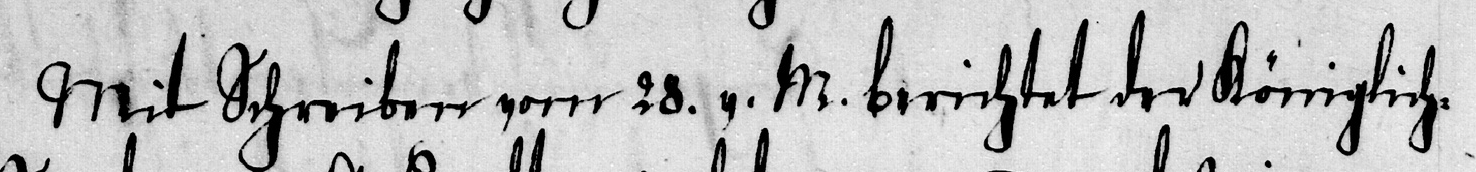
Mit Schreiben vom 28. v. M. berichtet der Königlic¬
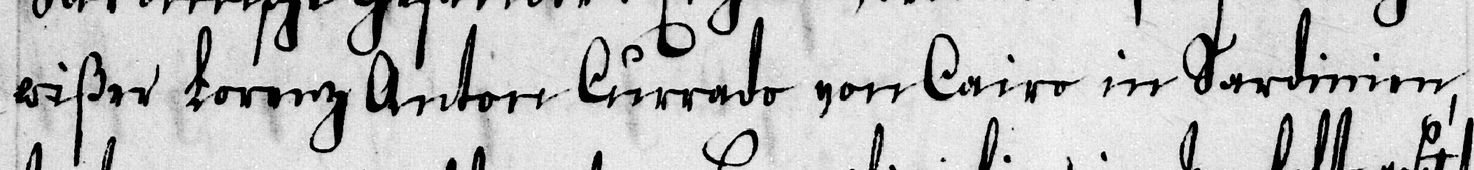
wißer Lorenz Anton Currado von Cairo in Sardinien,
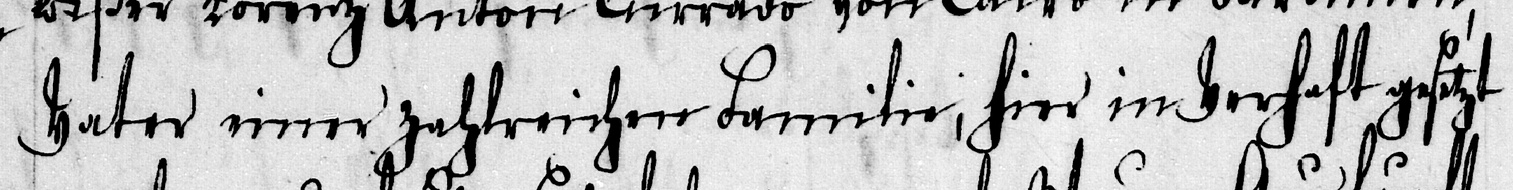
Vater einer zahlreichen Familie, hier in Verhaft ges¬
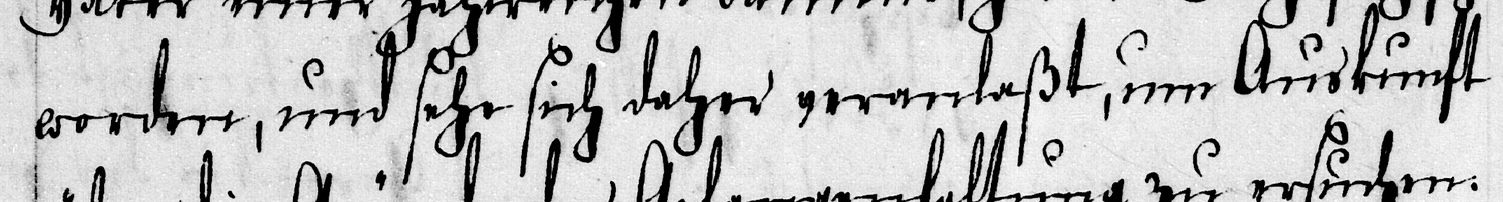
worden, und sehe sich daher veranlaßt, um Auskunft
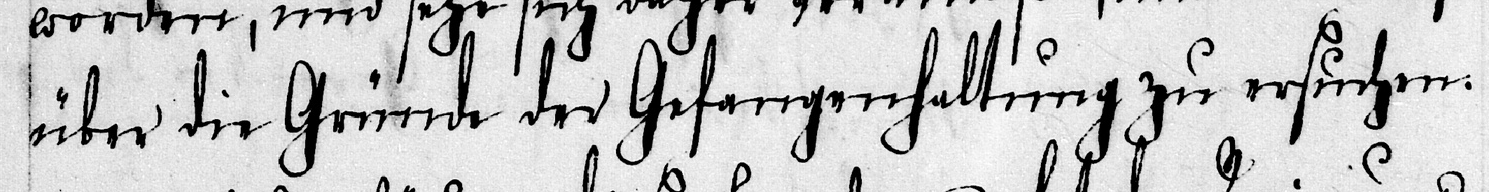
über die Gründe der Gefangenhaltung zu ersuchen.
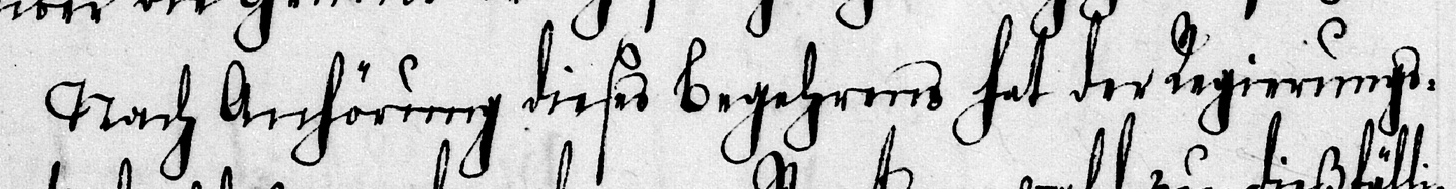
Nach Anhörung dieses Begehrens hat der Regierungs¬
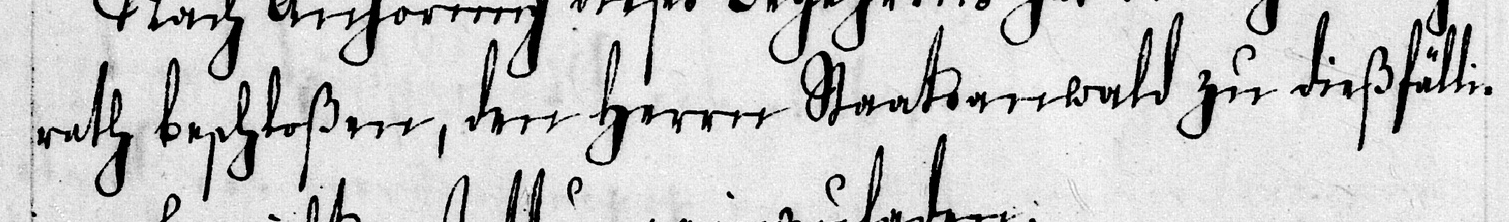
rath beschloßen, den Herrn Staatsanwald zu dießfäll¬
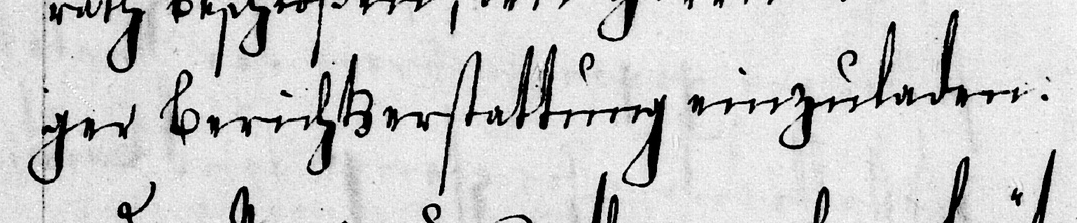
iger Berichtserstattung einzuladen.
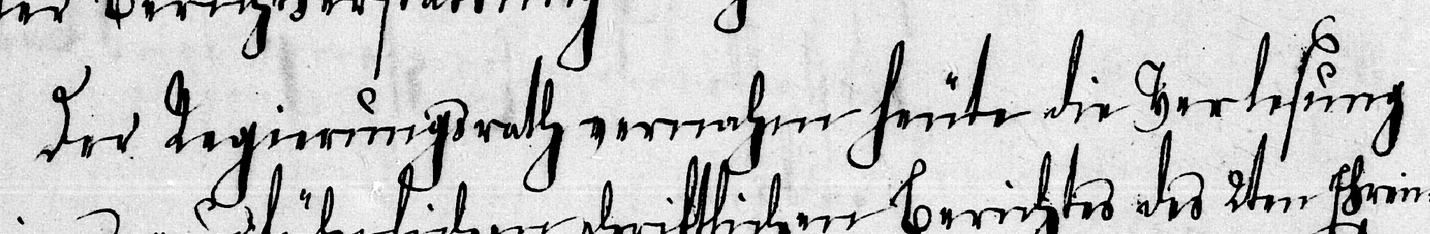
Der Regierungsrath vernahm heute die Verlesung
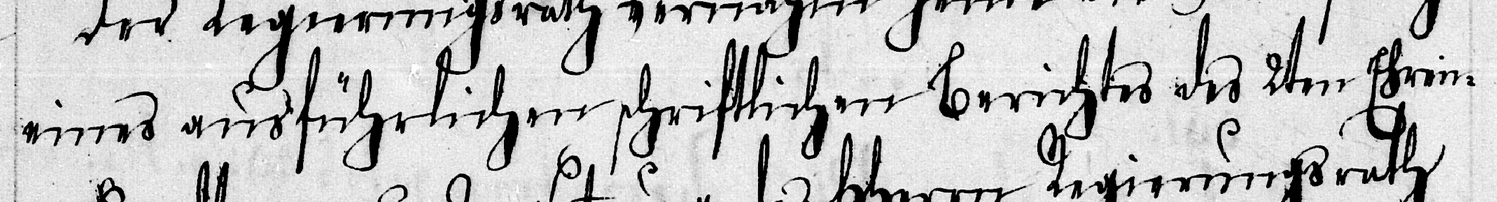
eines ausführlichen schriftlichen Berichtes des 2ten Ehren¬
